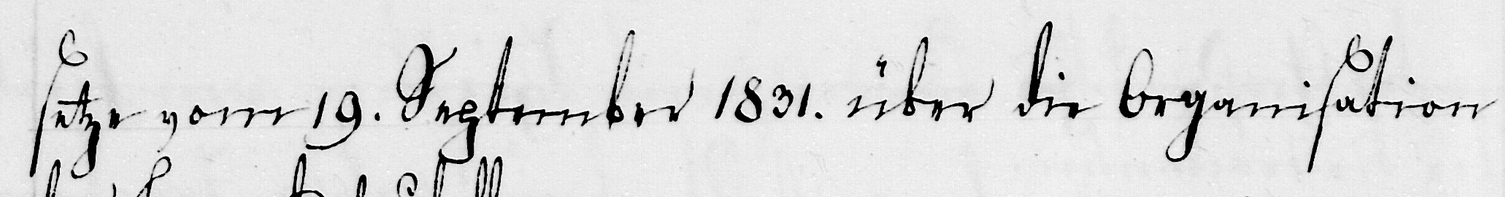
setze vom 19. September 1831. über die Organisation
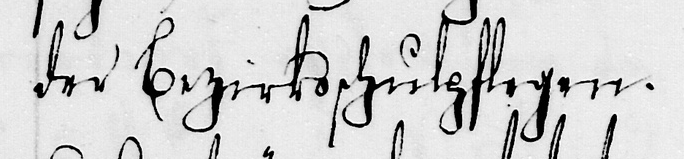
der Bezirksschulpflegen.
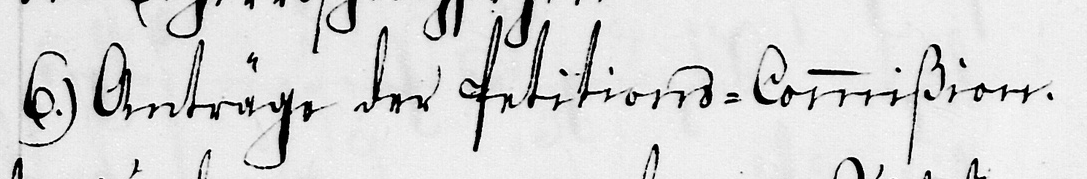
6.) Anträge der Petitions-Commißion.
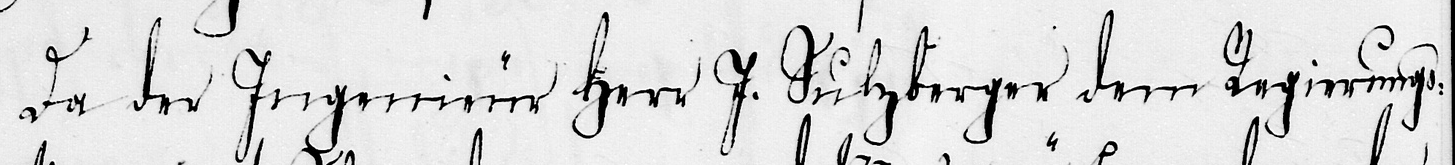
Da der Ingenieur Herr J. Sulzberger dem Regierungs¬
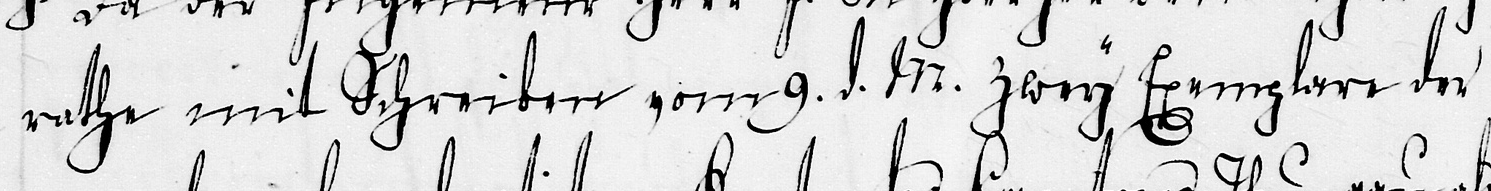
rathe mit Schreiben vom 9. d. M. zwey Exemplare der
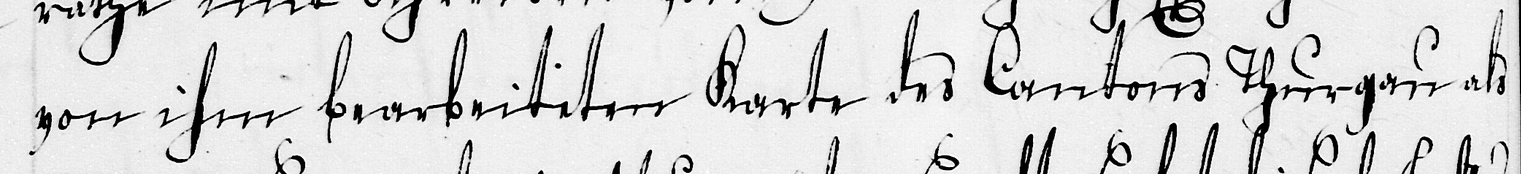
von ihm bearbeiteten Karte des Cantons Thurgau als
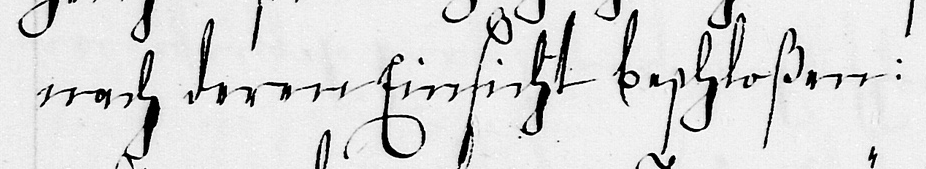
nach deren Einsicht beschloßen:
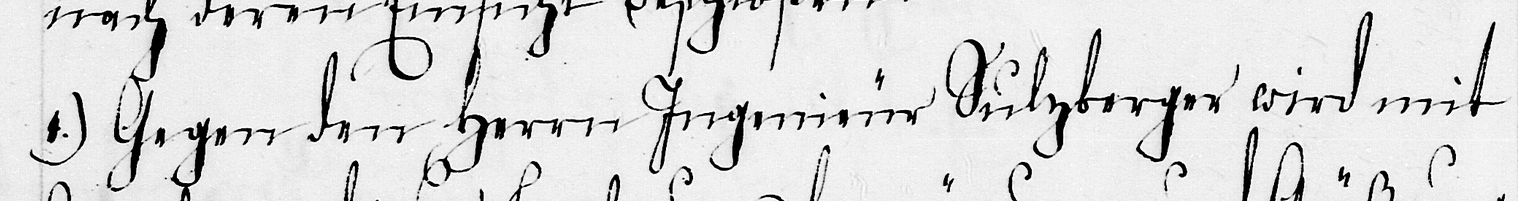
1.) Gegen den Herrn Ingenieur Sulzberger wird mit
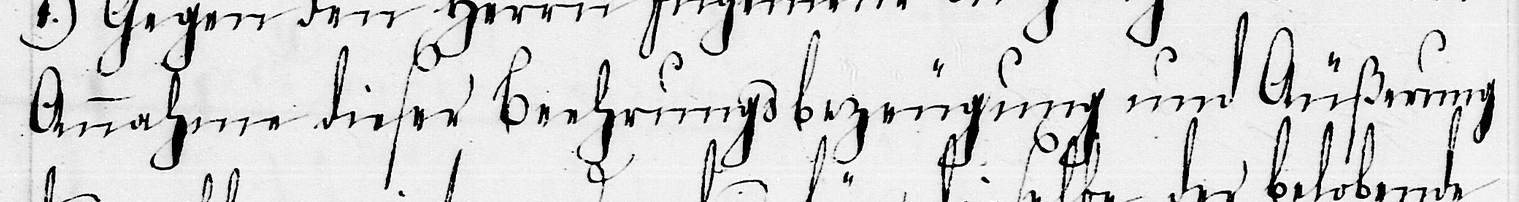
Annahme dieser Beehrungsbezeugung und Äußerung
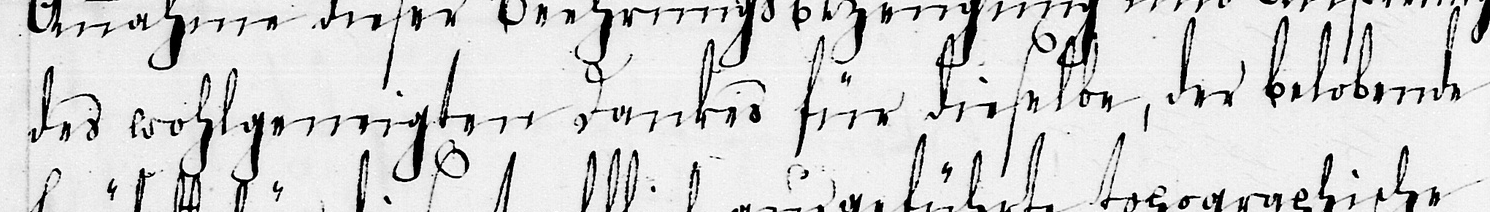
des wohlgeneigten Dankes für dieselbe, der belobende
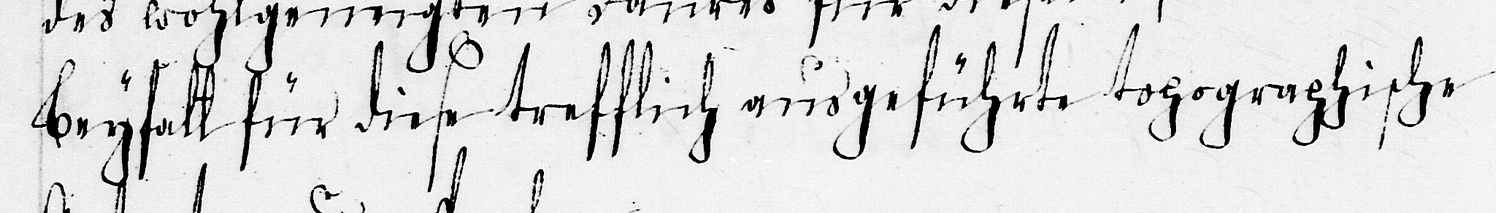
Beyfall für diese trefflich ausgeführte topographische
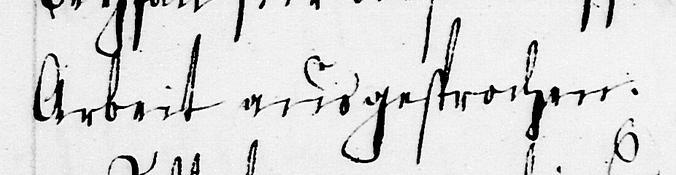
Arbeit ausgesprochen.
